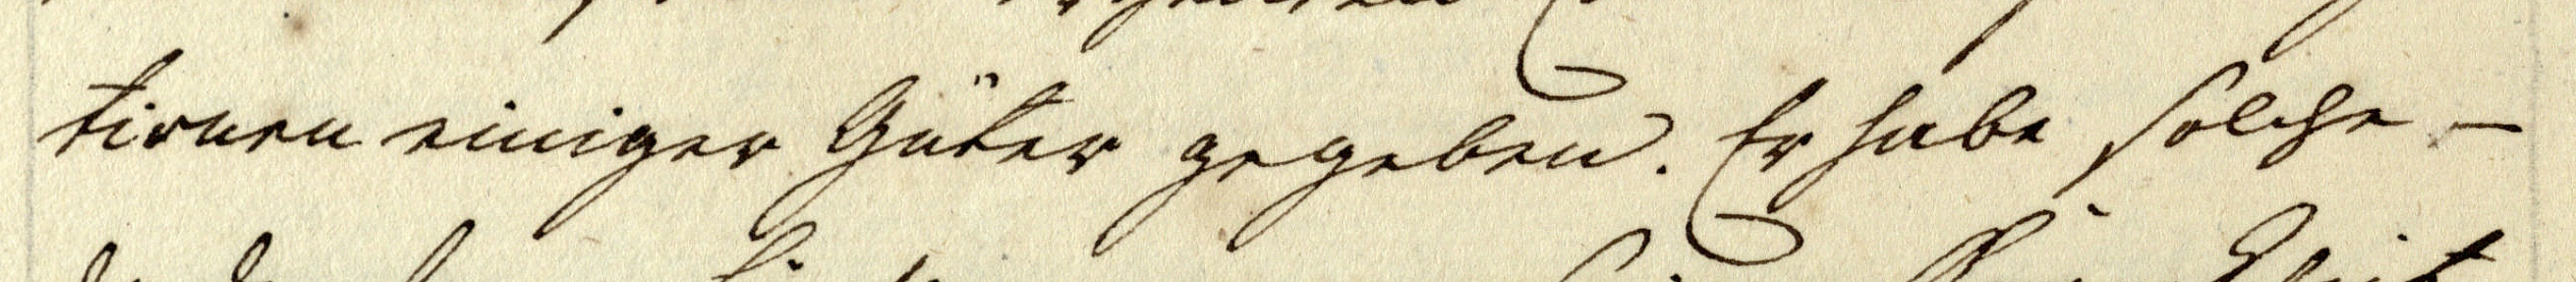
tionen einiger Güter gegeben. Er habe solche
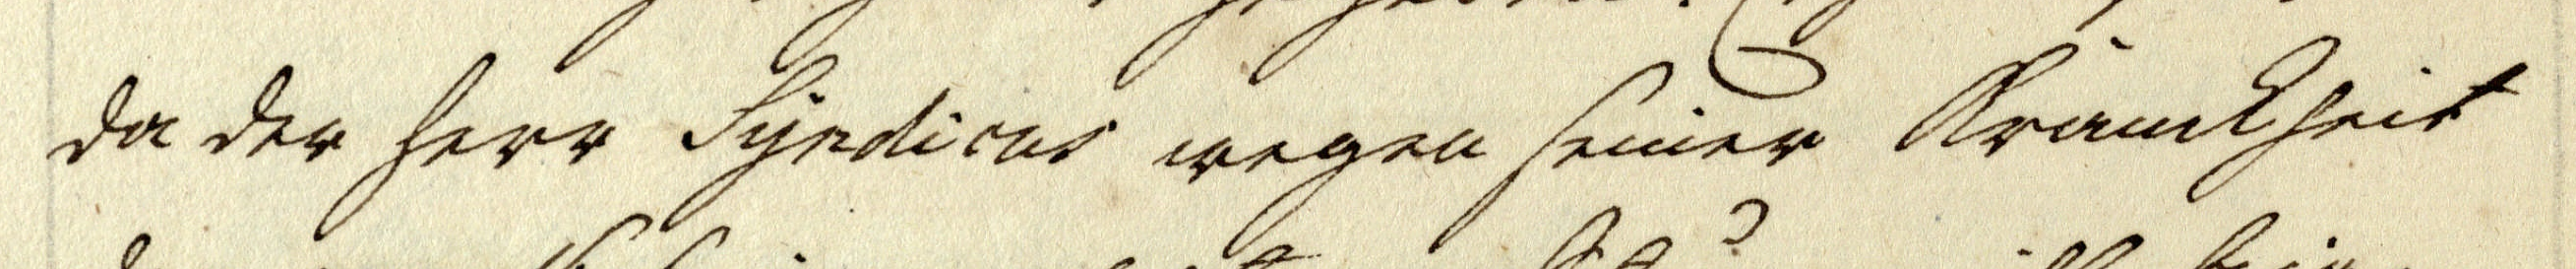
da der Herr Sÿndicus wegen seiner Kranckheit
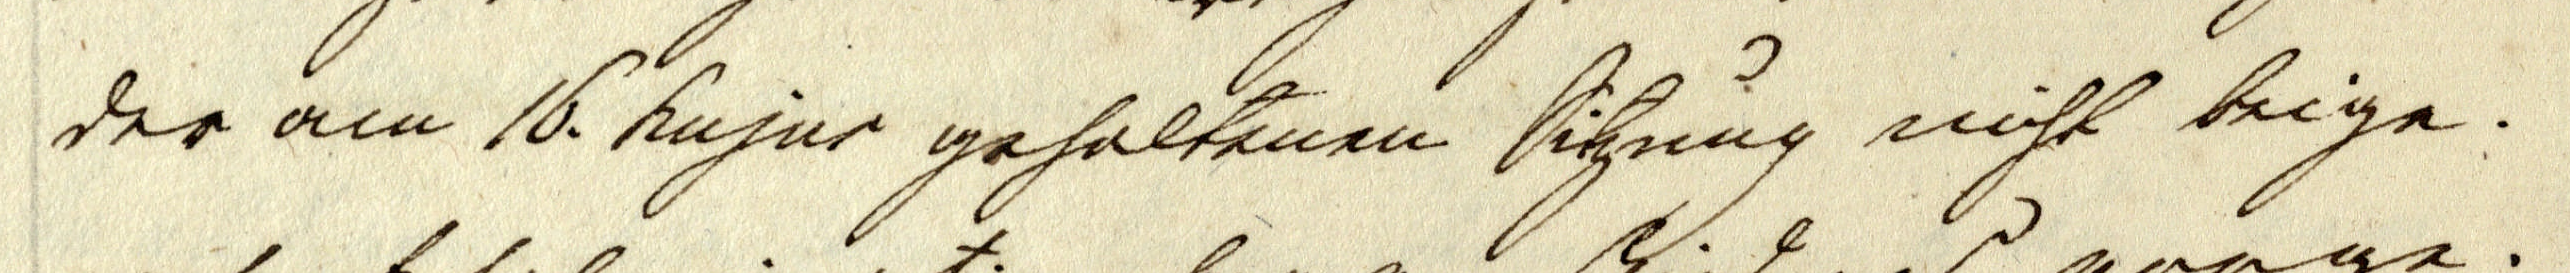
der am 16. hujus gehaltenen Sitzung nicht beige¬
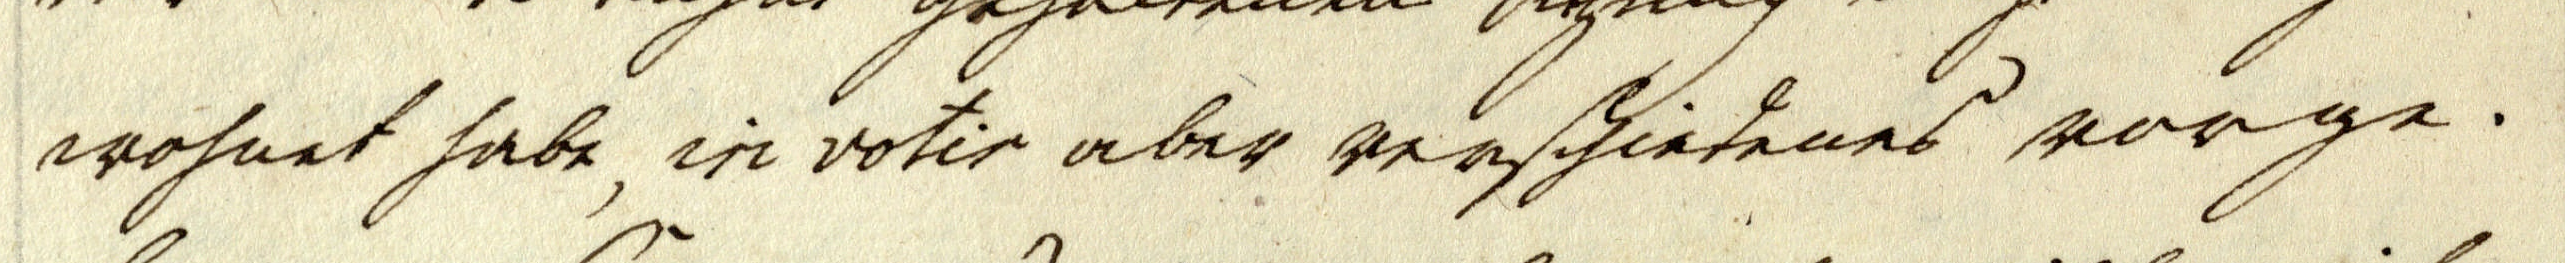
wohnet habe, in votis aber verschiedenes vorge¬
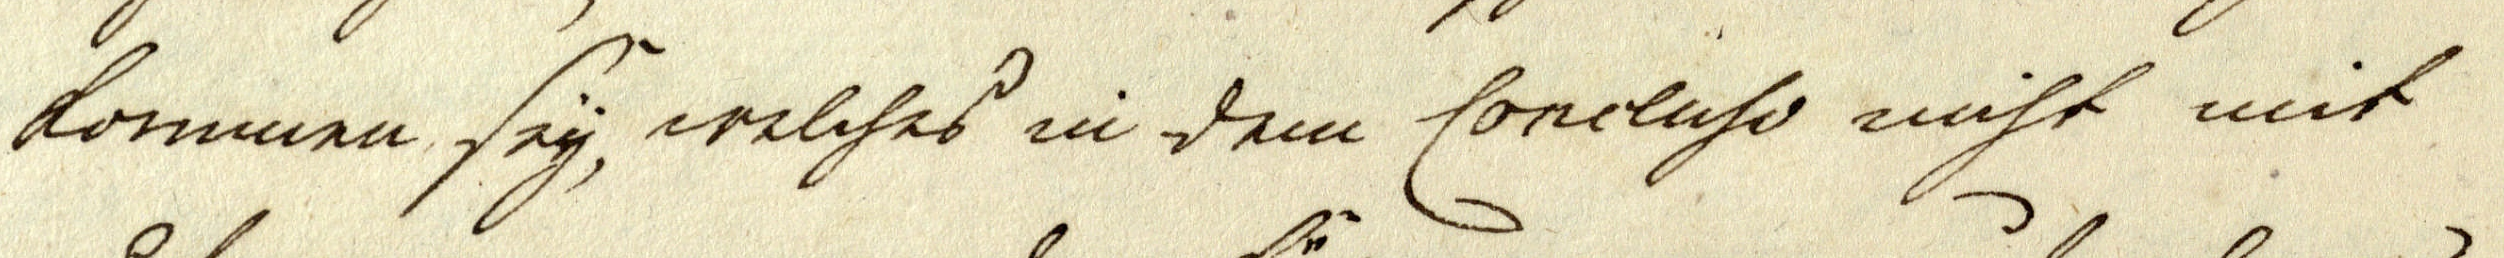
kommen seÿ, welches in dem Concluso nicht mit
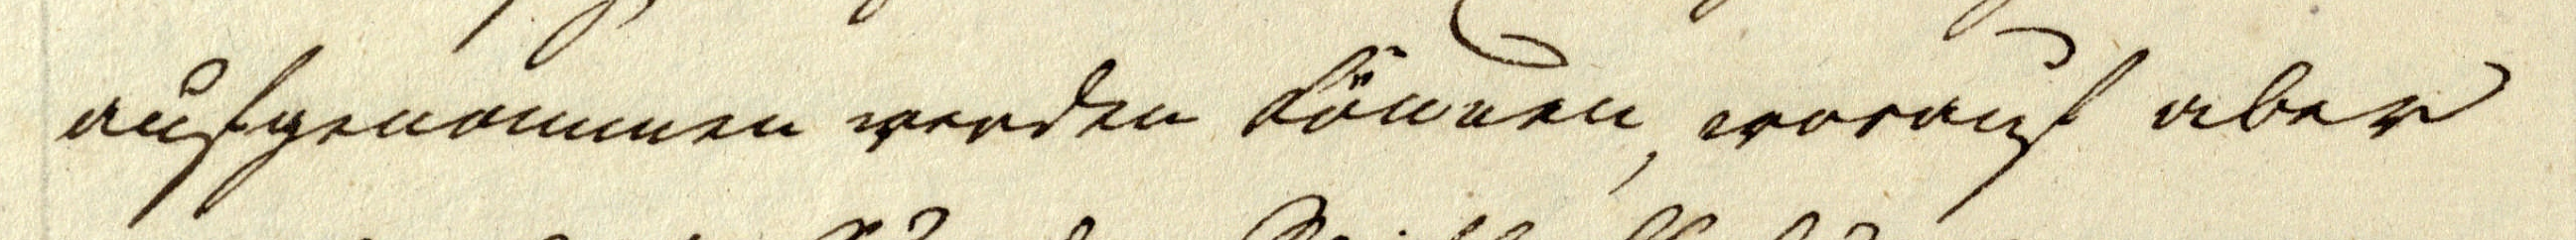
aufgenommen werden können, worauf aber
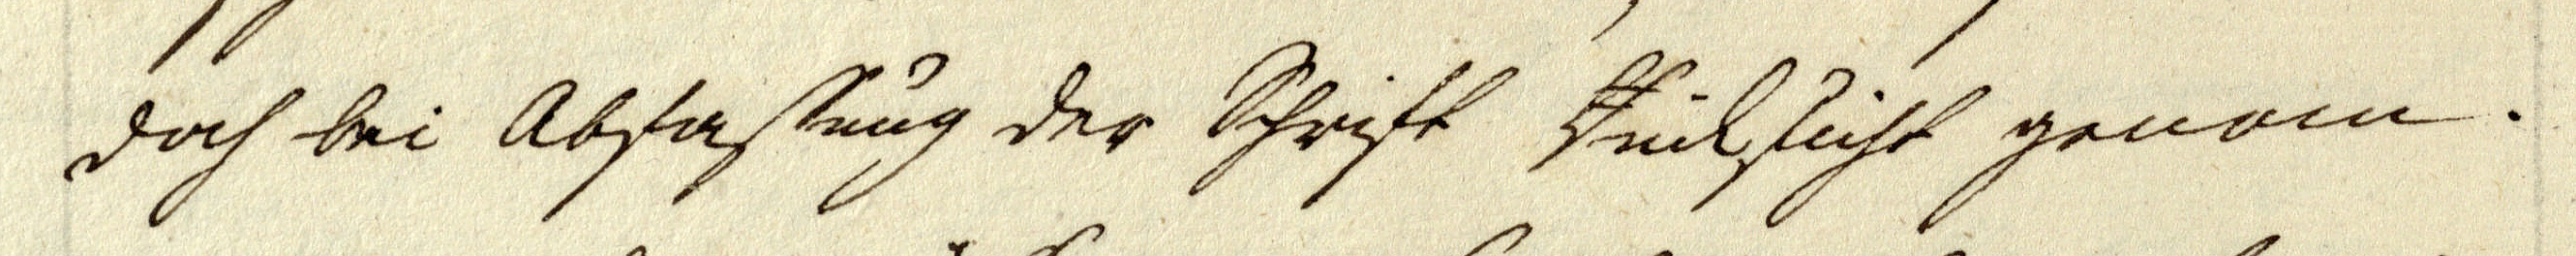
doch bei Abfassung der Schrift Rücksicht genom¬
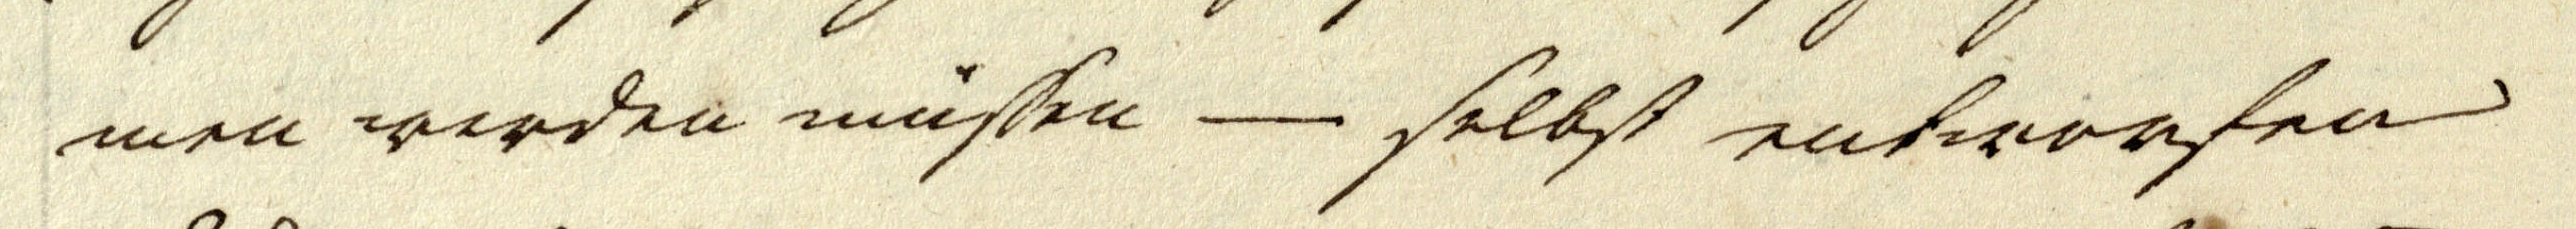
men werden müssen selbst entworfen
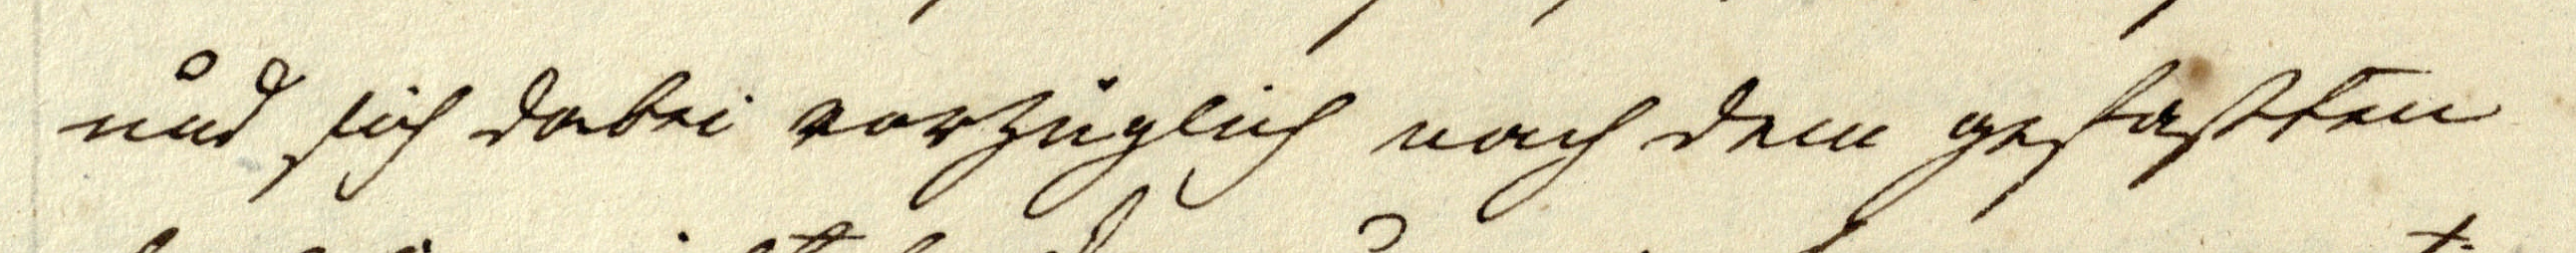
und sich dabei vorzüglich nach dem gefaßten
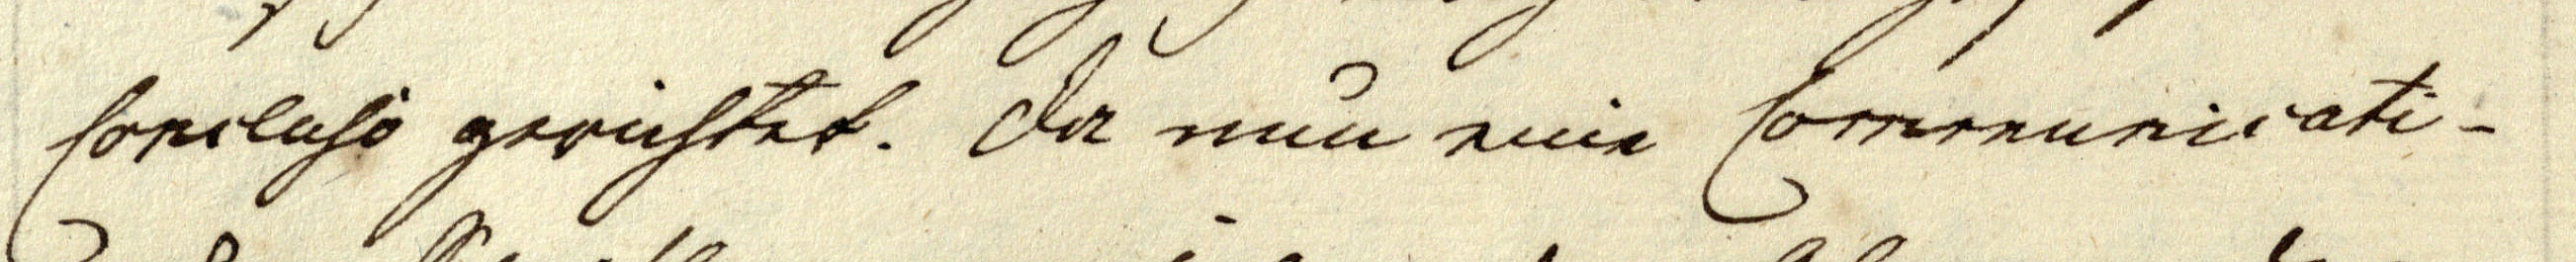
Concluso gerichtet Da nun eine Communicati¬
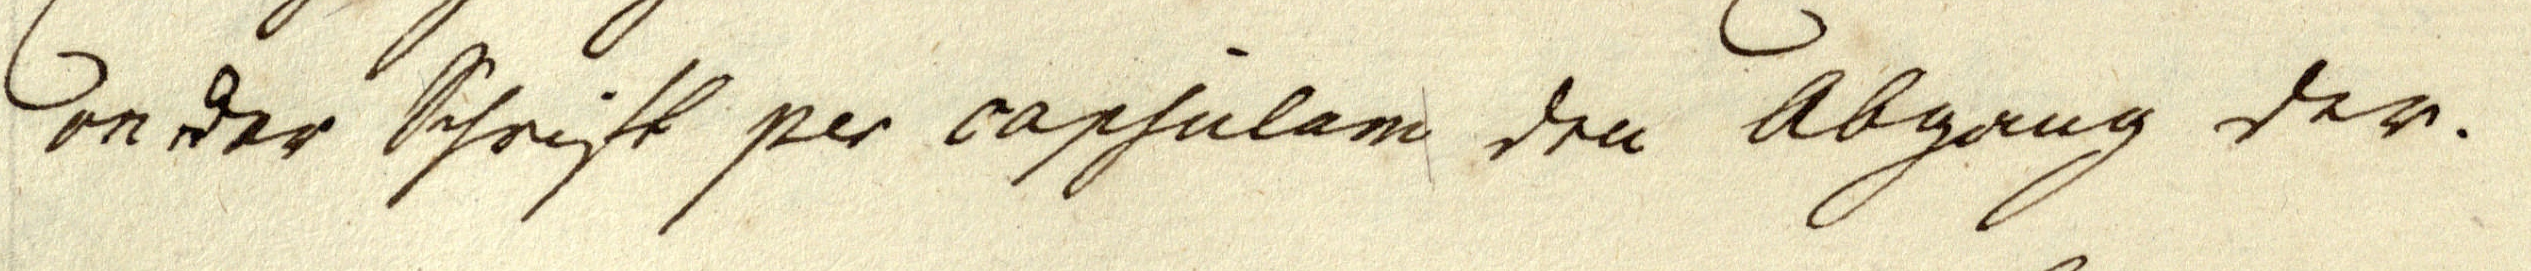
on der Schrift per capsulam den Abgang der¬
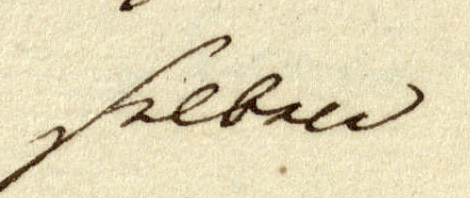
selben
